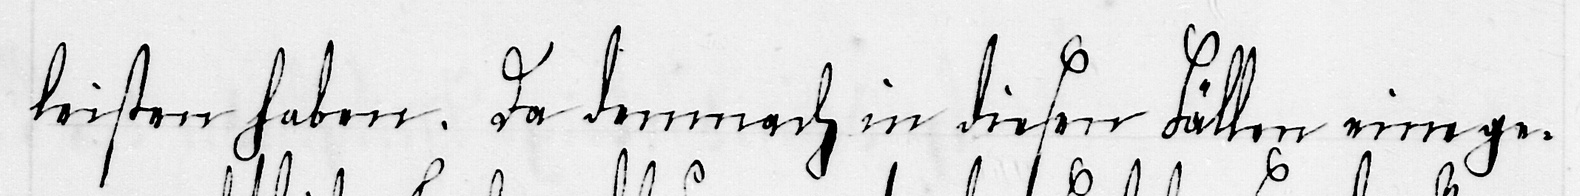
leisten haben. Da demnach in diesen Fällen eine ge¬
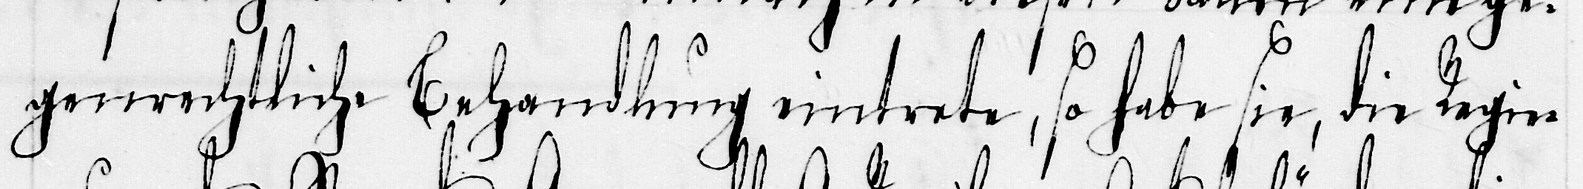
genrechtliche Behandlung eintrete, so habe sie, die
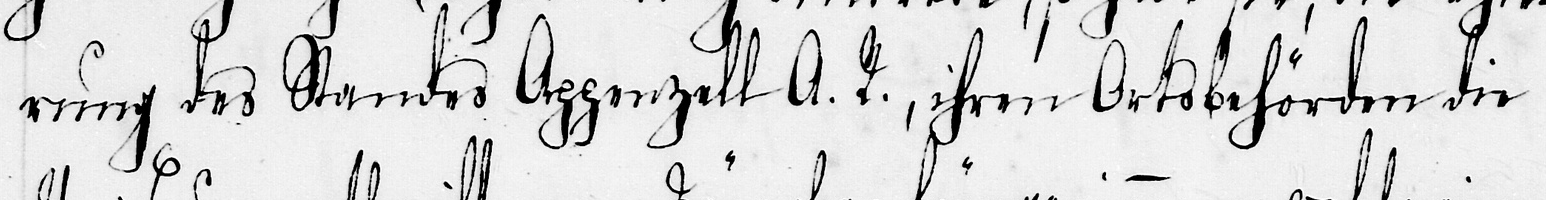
erung des Standes Appenzell A. R., ihren Ortsbehörden die
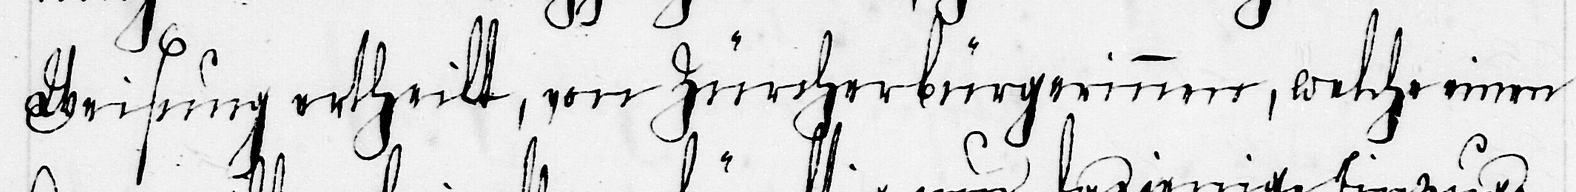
Weisung ertheilt, von Zürcherbürgerinnen, welche einen
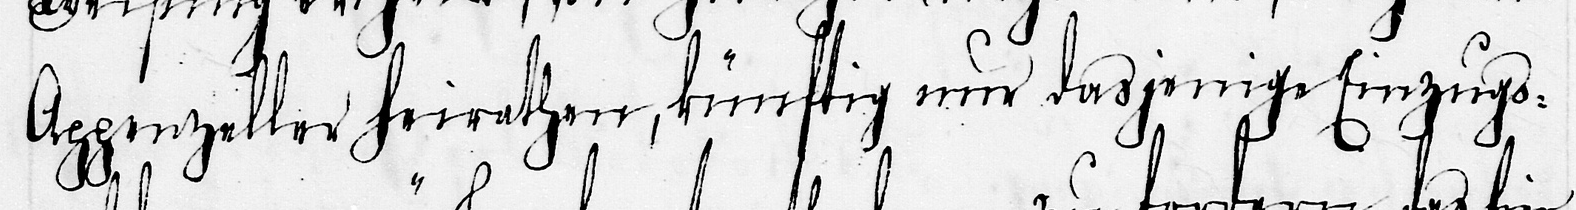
Appenzeller heirathen, künftig nur dasjenige Einzugs¬
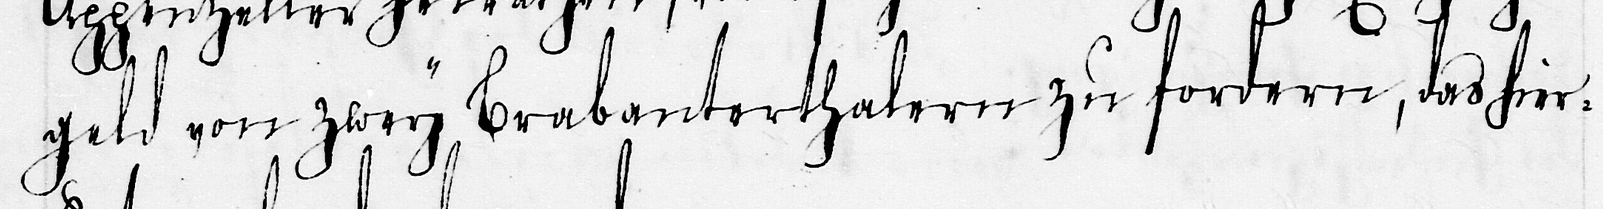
geld von zwey Brabanterthalern zu fordern, das hier¬
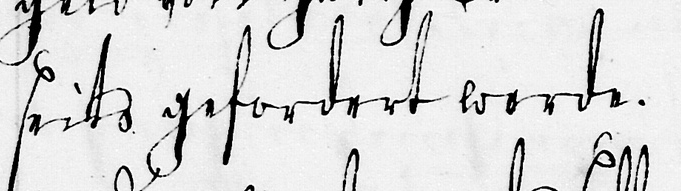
seits gefordert werde.
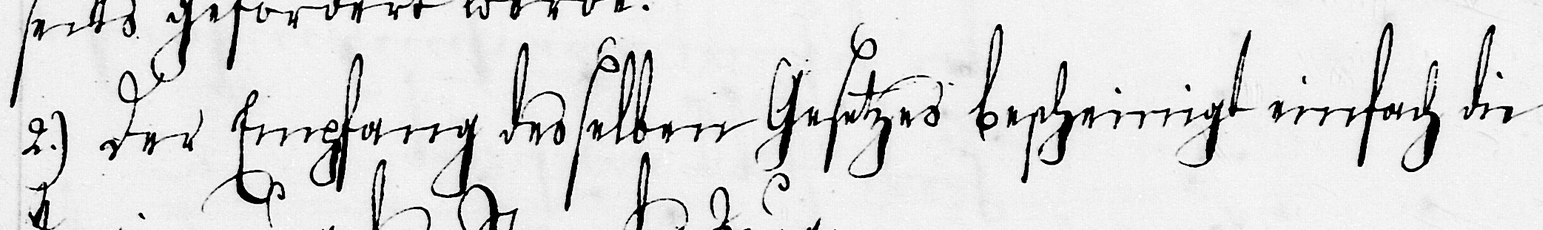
2.) Der Empfang desselben Gesetzes bescheinigt einfach die
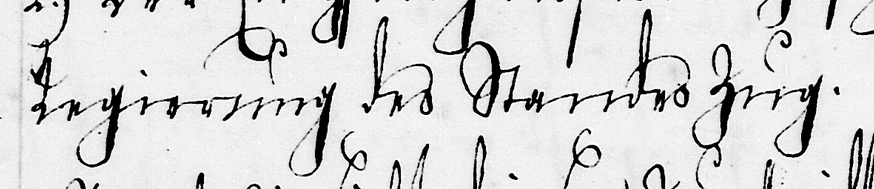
Regierung des Standes Zug.
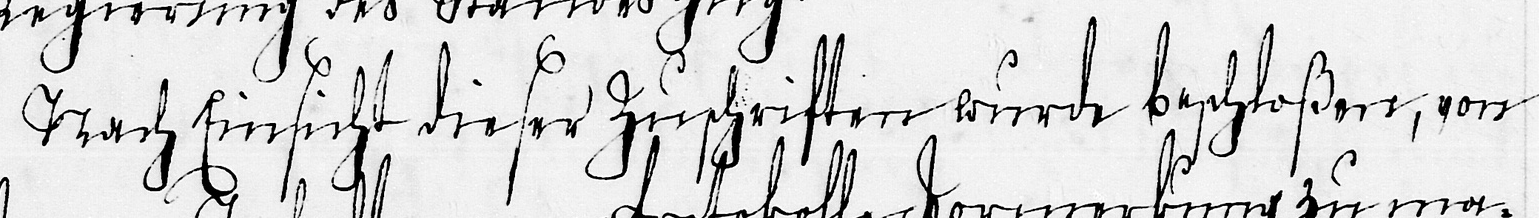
Nach Einsicht dieser Zuschriften wurde beschloßen, von
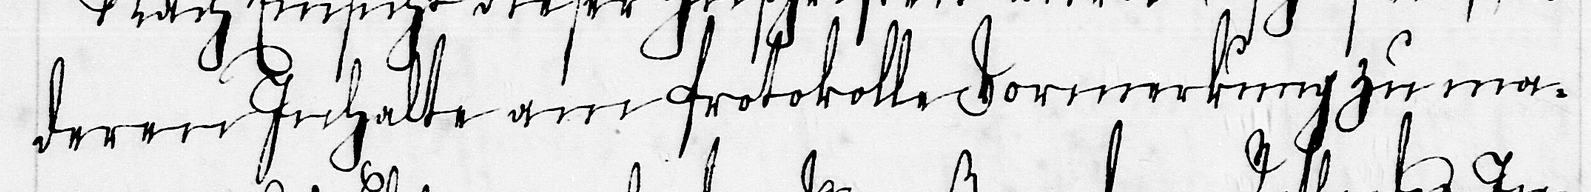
deren Inhalte am Protokolle Vormerkung zu ma¬
